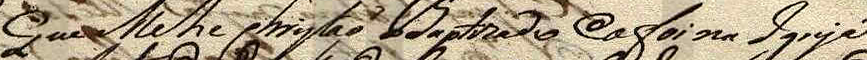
Que elle he Christaõ Baptizado e o foi na Igreja
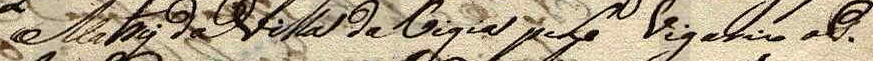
Matris da Villa da Vigia pelo Vigario o P.
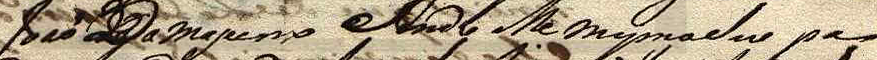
Joaõ Damasceno Sendo elle mesmo seo pa
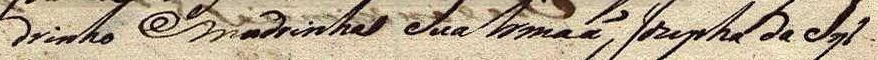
drinho e madrinha sua Irmaã Jozepha da Syl
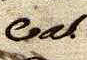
va.
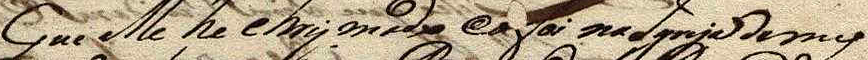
Que elle he chrismado e o foi na Igreja de mes
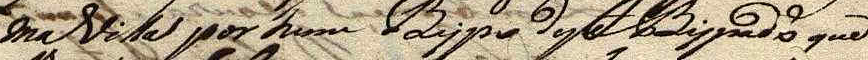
ma Villa por hum Bispo deste Bispado que
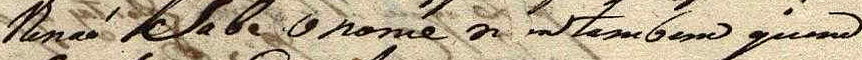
lhenaõ sabe o nome n_m tambem quem
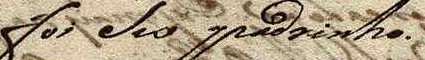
foi seo padrinho.
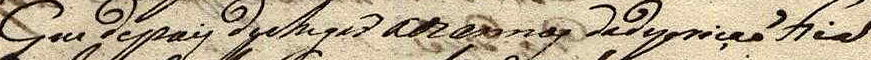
Que depois de chegar aos annos da descriçaõ hia
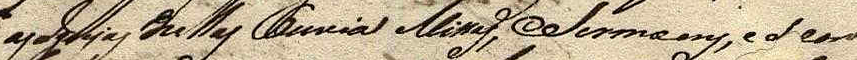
as Igrejas nellas Ouvia Missas, e sermoens, e s_ con
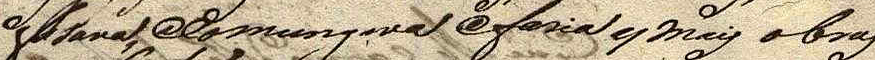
fesava, e comungava e fazia as mais obras
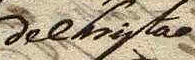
de christaõ.
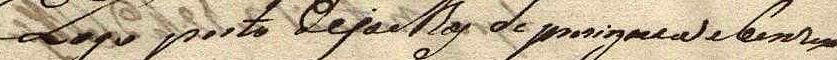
E Logo posto de joelhos se presignou e benzeo
